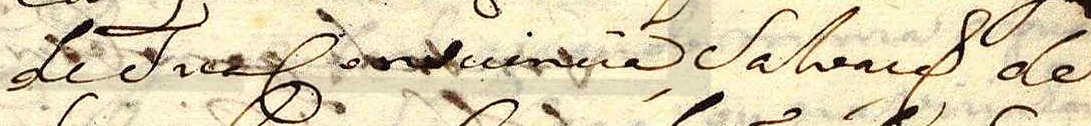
de Sua Consciencia, Salvaçaõ de
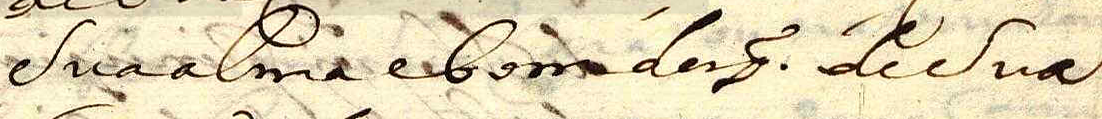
Sua alma, e bom desp.o de Sua
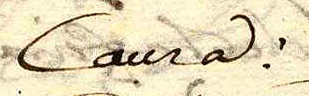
Cauza:
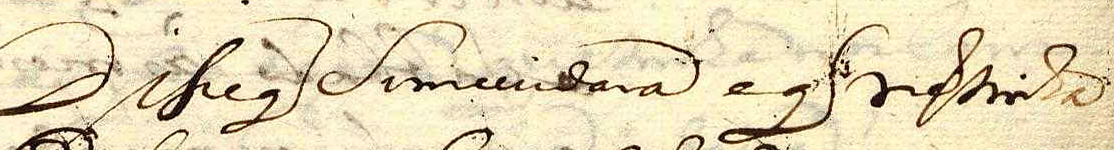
Disse q̄ Sim cuidara e q̄ naõ tinha
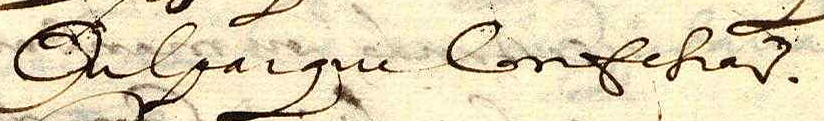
Culpas que Confessar.
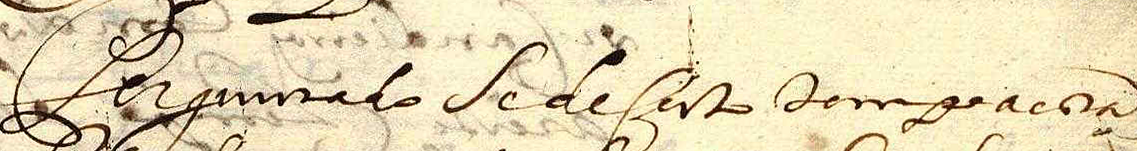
Perguntado Se de Certo tempo a esta
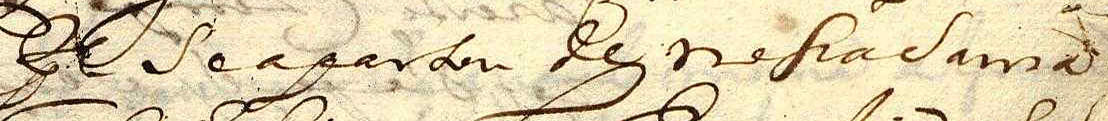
pte se apartou de nossa Santa
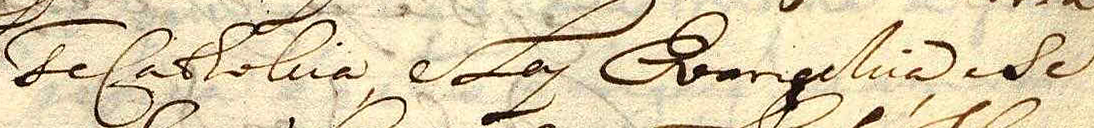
Fe Catholica, e Ley Evangelica, e Se
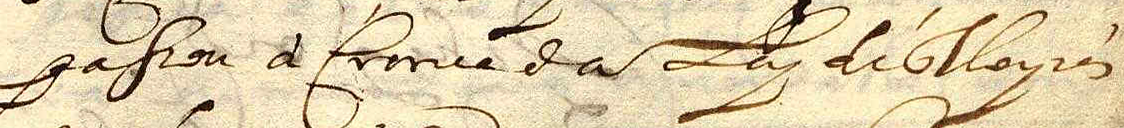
passou á Crença da Ley de Moyzés
